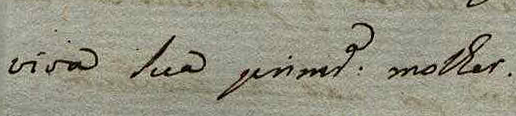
viva Sua primr.a molher.
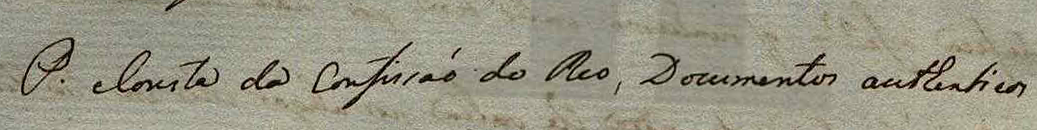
P. e Consta da Confissaõ do Reo, Documentos authenticos
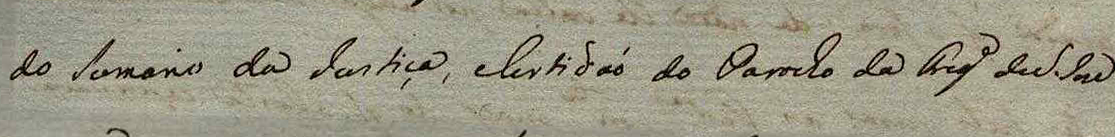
do Sumano da Iustiça, e Certidaõ do Parocho da Frega de S Ioze
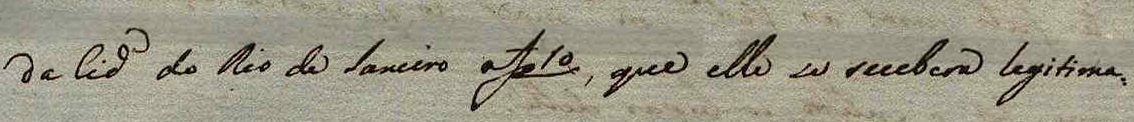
da Cide do Rio de Ianeiro a f 10, que elle se recebera legitima
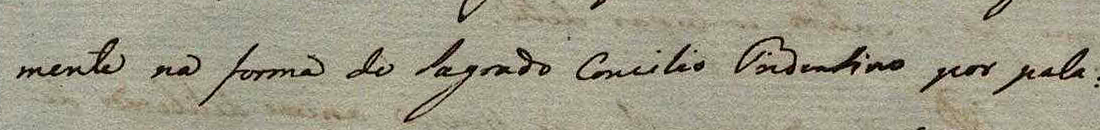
mente na forma do Sagrado Concilio Tridentino por pala
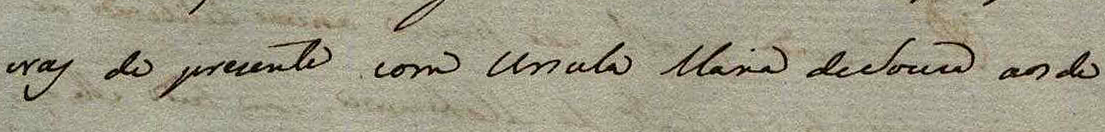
vras de prezente com Ursula Maria de Souza aos de
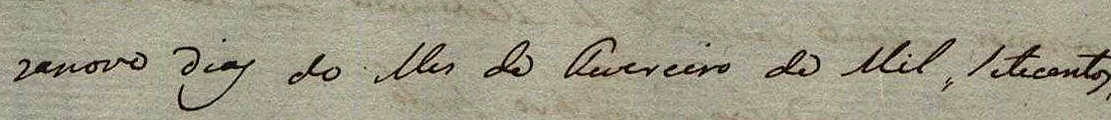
zenove dias do Mes de Fevereiro de Mil, Setecentos,
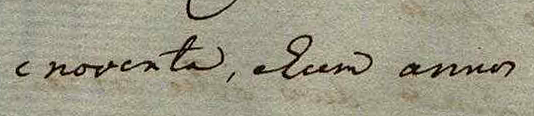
e noventa, e hum annos
